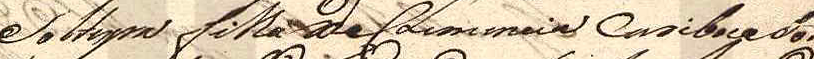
Solteyra filha de CLemencia cariboca Sol
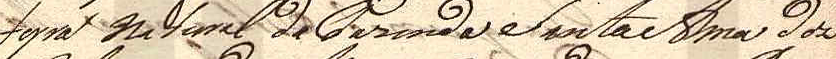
teyra natural da Fazenda Santa Anna doz
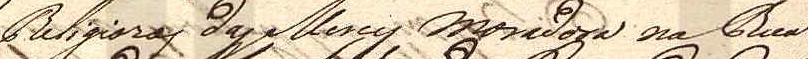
Religiozos das Merces moradora na Rua
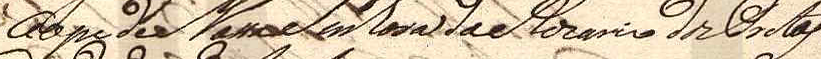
ao pe de Nossa Senhora do Rozario doz Pretos
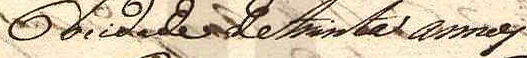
de idade de trinta annos
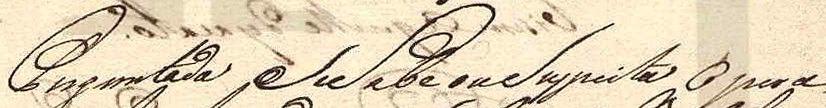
Perguntada Se Sabe ou Suspeita o para
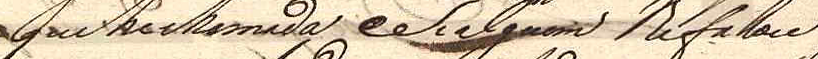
que he chamada e Se alguem lhe falou
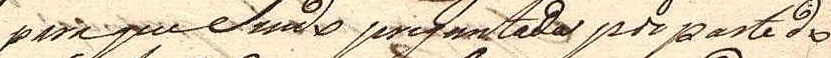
para que Sendo preguntada por parte do
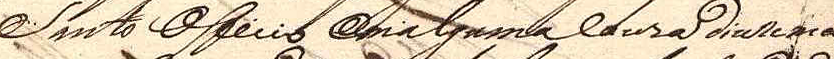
Santo Officio em alguma couza dicesse ma
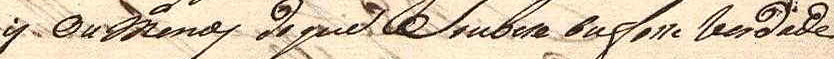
is ou menos do que Soubese ou fosse verdade
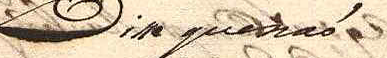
Disse que naõ
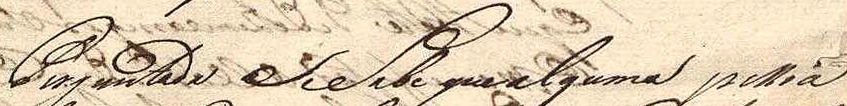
Perguntada se Sabe que alguma pessoa
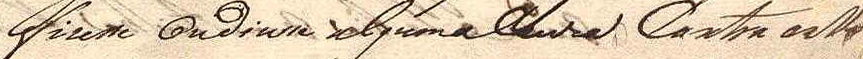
fizesse ou dicesse alguma Couza Contra o No
